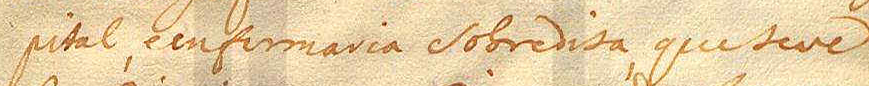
pital, e enfermaria sobredita, que teve
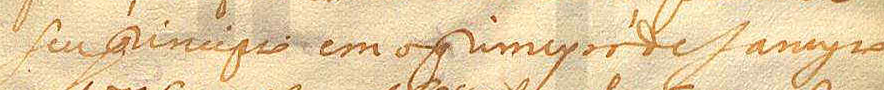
seu principio em o primeyro de Janeyro
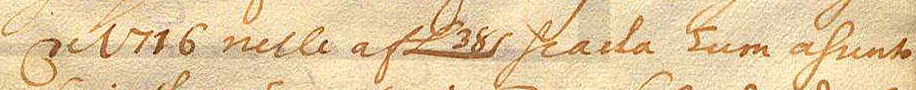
de 1716 nelle a fl 38 se acha hum assento
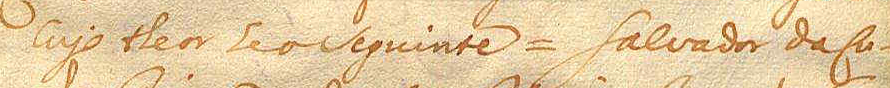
cujo theor he o Seguinte = Salvador da Cu
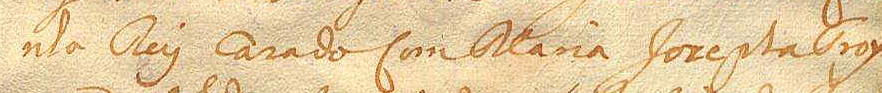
nha Reis cazado Com Maria Jozepha Troy
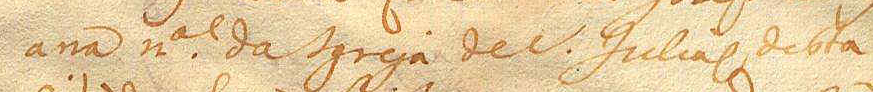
ana n.al da Igreja de S. Juliaꝭ desta
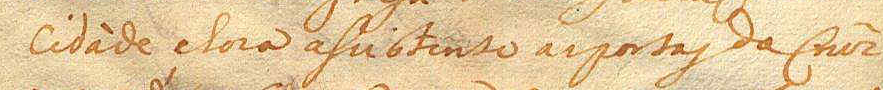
cidade e hora assistente as portas da Cruz
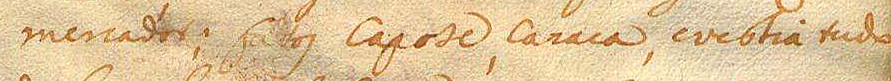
mercador; fatos Capote, cazaca, e vestia tudo
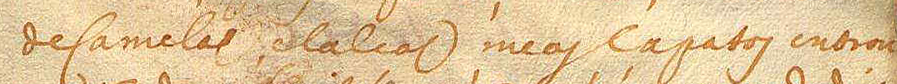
de Camelaꝭ, e calçaꝭ meas çapatos entrou
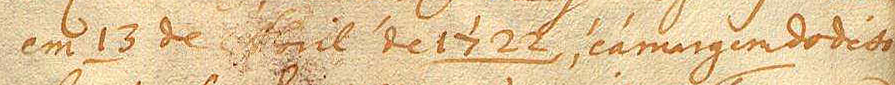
em 13 de Abril de 1722, e a margem do dito
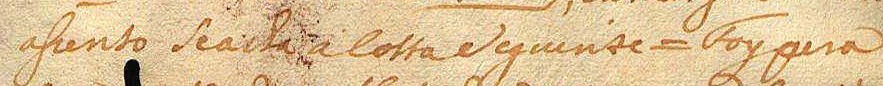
assento se acha a cotta Seguinte = Foy pera
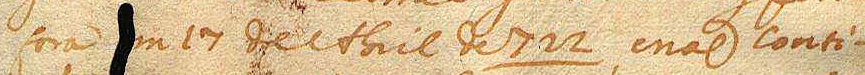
fora _m 17 de Abril de 722, e naꝭ conti
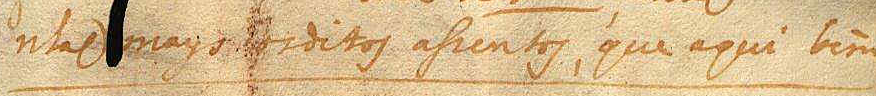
nhaꝭ mays dos ditos assentos, que aqui bem
